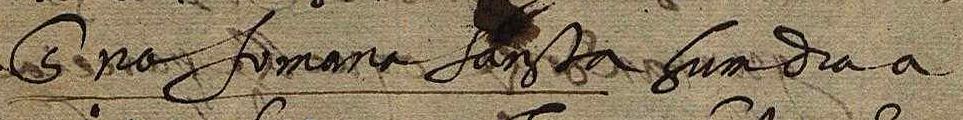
q̄ na somana sancta hum dia a
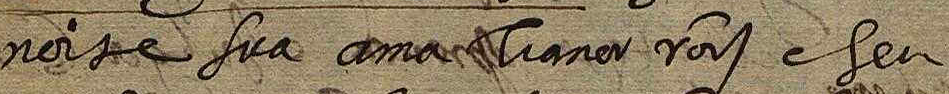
noite sua ama lianor roīz e seu
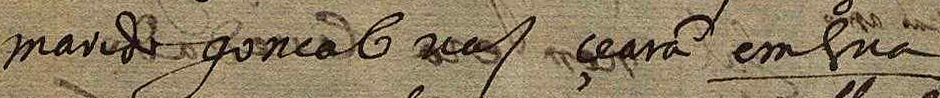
marido goncalo uaz cearā em sua
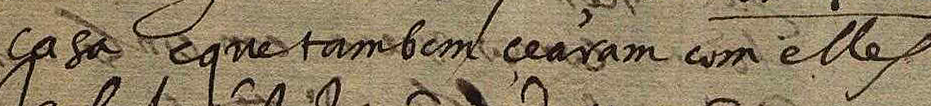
casa e que tambem cearam com elles
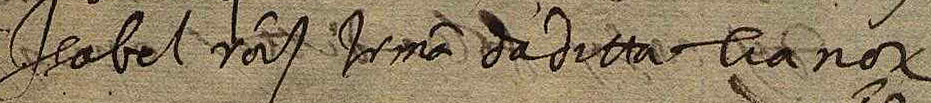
Jsabel rōiz Jrmā da ditta lianor
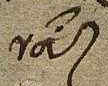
roīz
